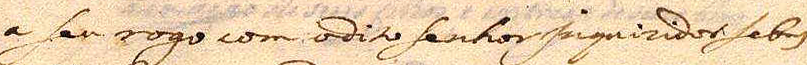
a seu rogo com o dito senhor jnquizidor sebas
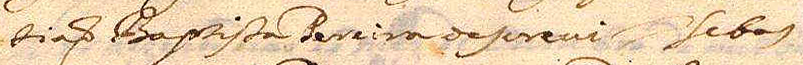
tiaõ Baptista Pereira o escreui // sebas
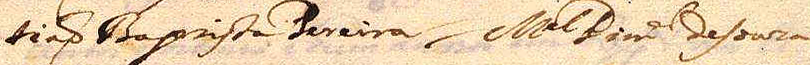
tiaõ Baptista Pereira // Mel Pimel de souza
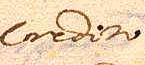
Credito
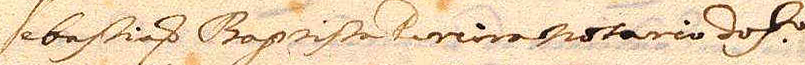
Sebastiaõ Baptista Pereira notario do s.to
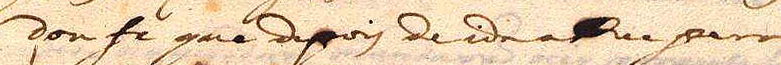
dou fe que depois de ida a Ree pera
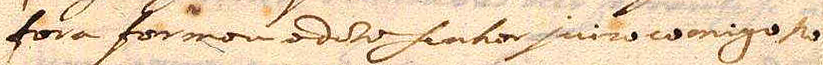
fora formou o dito senhor juizo comigo no
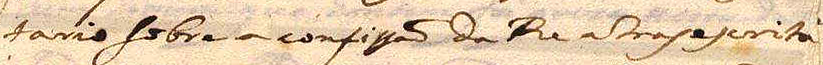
tario sobre a confissaõ da Re atras escrita
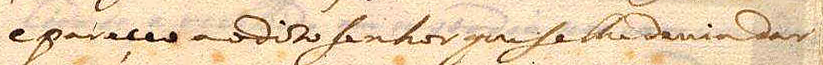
e pareçeo ao dito senhor que se lhe deuia dar
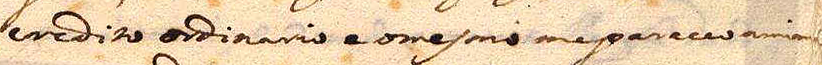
credito ordinario e o mesmo me pareceo a mim
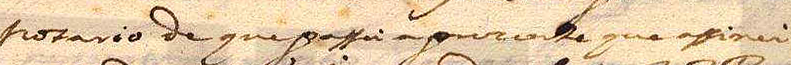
notario de que passei a prezente que assinei
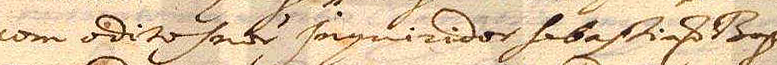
com o dito snor̄ Jnquizidor sebastiaõ Bap
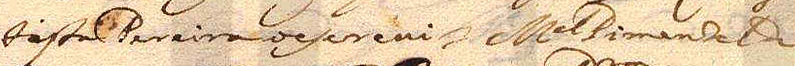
tista Pereira o escreui // Mel Pimentel de
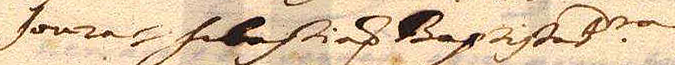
souza // sebastiaõ Baptista P.ra
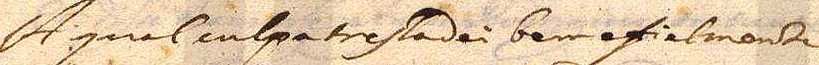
A qual culpa tresladei bem e fielmente
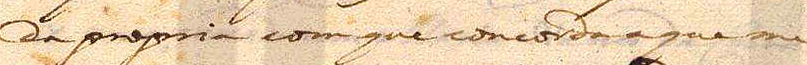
da propria com que concorda a que me
